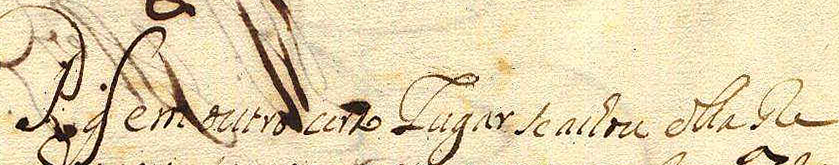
P. q̄ em outro certo Lugar se achou ella Re
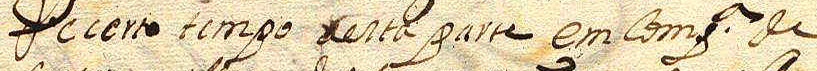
de certo tempo a esta parte em comp.a de
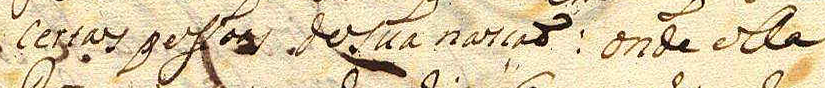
certas pessoas de sua nazçaõ: onde ella
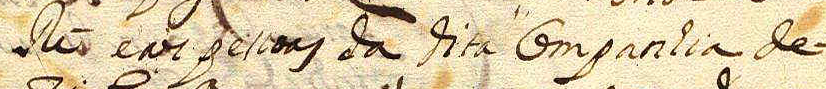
Ré e as pessoas da dita Companhia de
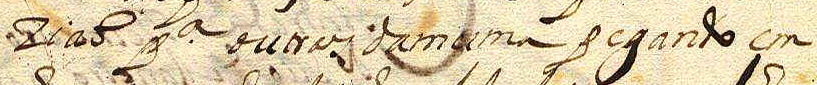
Ziaõ p.a outras da mesma pegando em
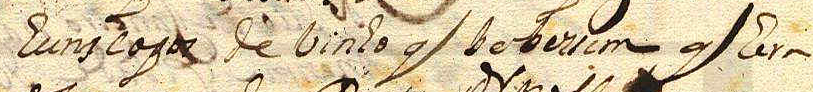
huns copos de vinho q̄ bebessem q̄ hera
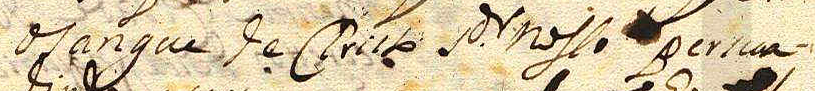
o sangue de Christo s.or nosso persua
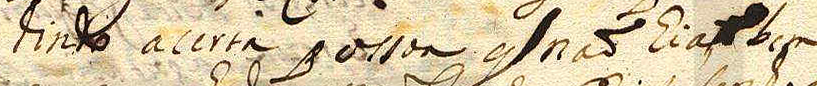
dindo a certa pessoa q̄ naõ hia bem
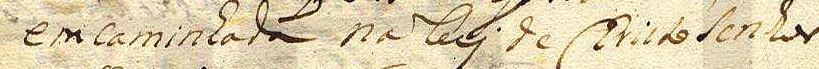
emcaminhada na lej de Christo senhor
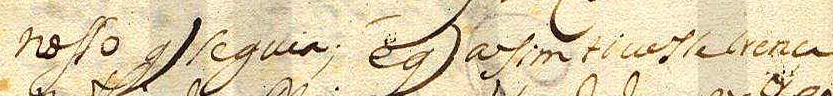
nosso q̄ seguia; e q̄ asim tiuesse crença
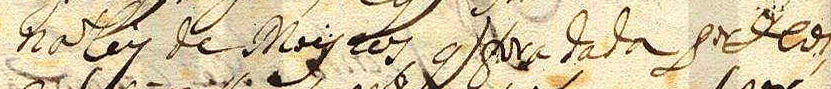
na ley de Moyzes, q̄ fora dada por Deos,
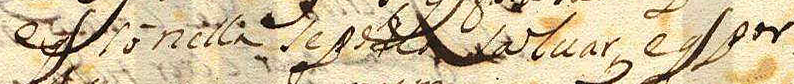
e q̄ só nella se podia saluar, e q̄ por
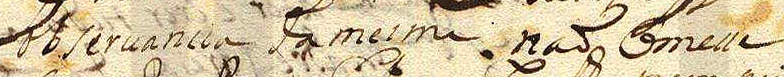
obseruancia da mesma naõ Comesse
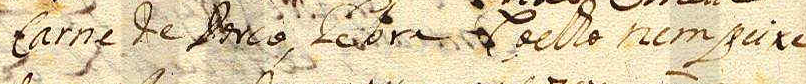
Carne de Porco, Lebre Coelho nem peixe
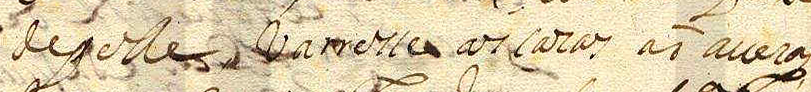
de pelle, varrezse as cazas as auezas
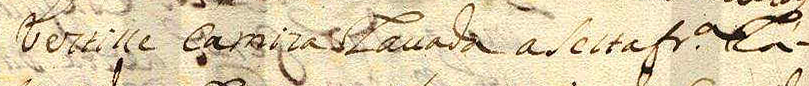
veztisse camiza Lauada a sesta fr.a La
